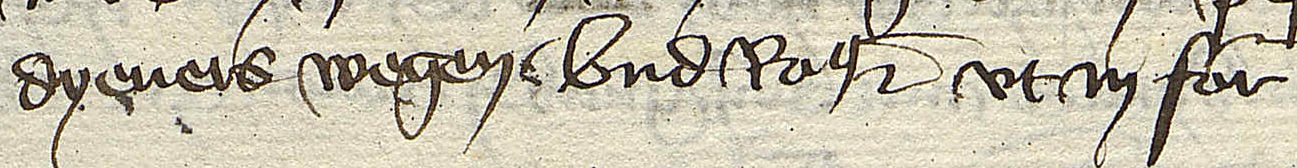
dyeners wegen / vnd Ro* ec* vt in for*
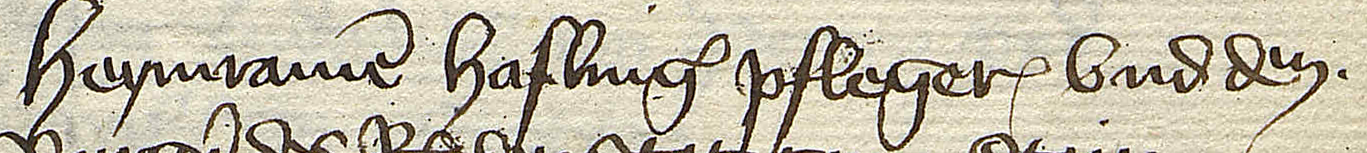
heymram* haſling* pfleger* vnd den .
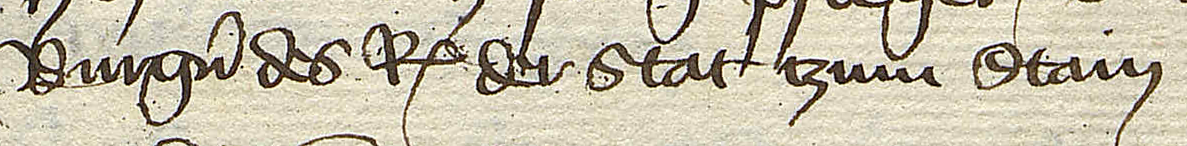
Burg*n des R* der Stat cʒum Stain
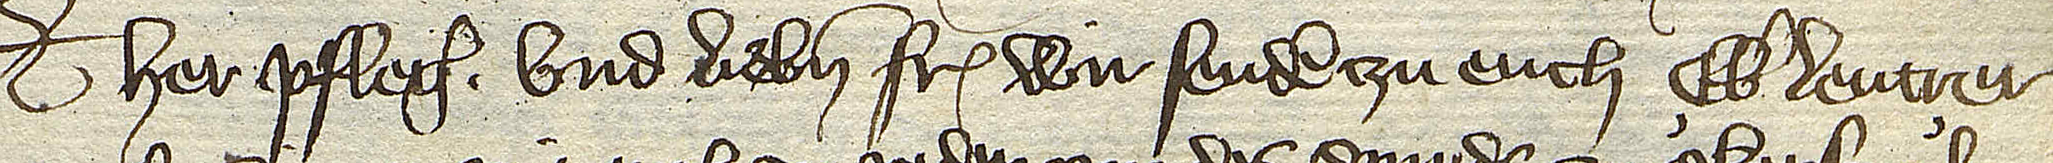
L* her pfleg* . vnd lieb*n fr* wir ſende* cʒu euch Eb* leutrer
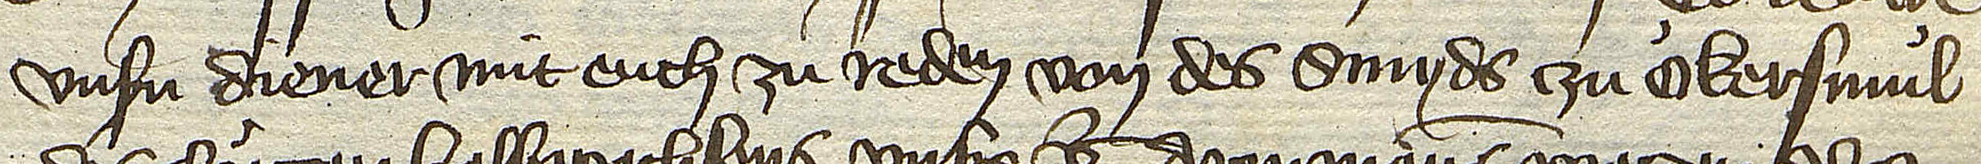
vnſ*n diener mit euch cʒu reden von des Smyds cʒu Ökerſmül
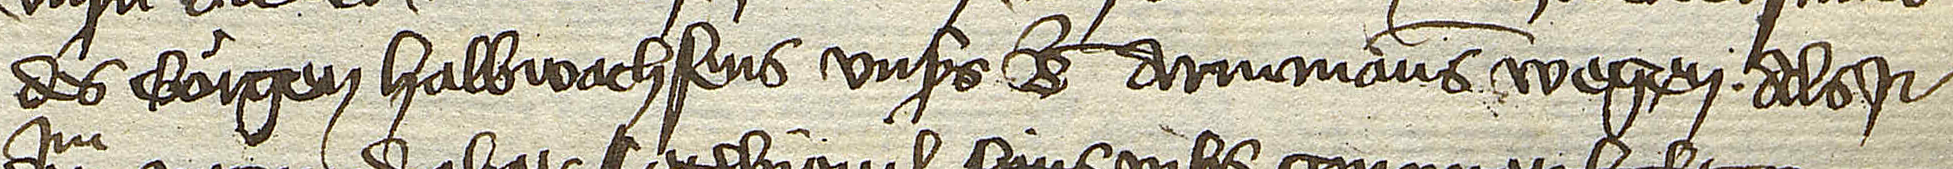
des Görgen halbwachſens vnſ*s B* Armman*s wegen . Als Ir
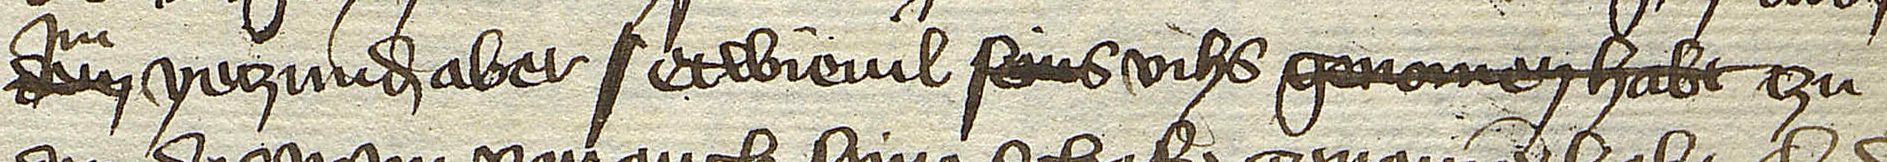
dem yecʒund* aber ſ etwieuil ſeins vihs genomen habt cʒu
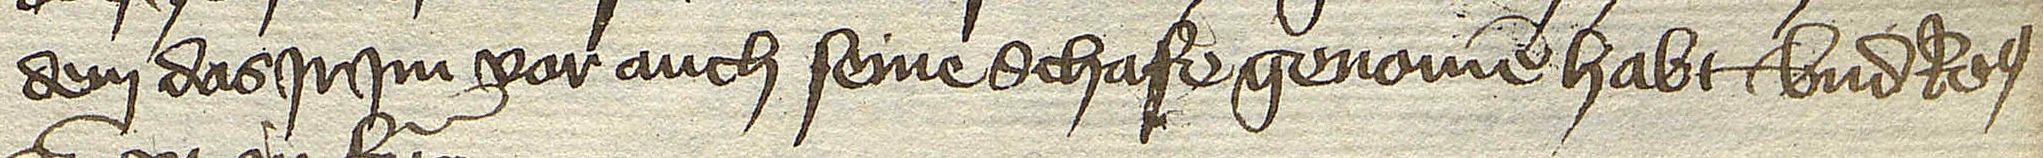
dem das Ir Im vor auch ſeine Schafe genome* habt / Vnd Ro*
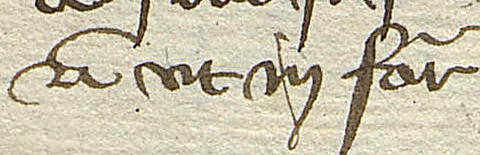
ec* vt in for*
